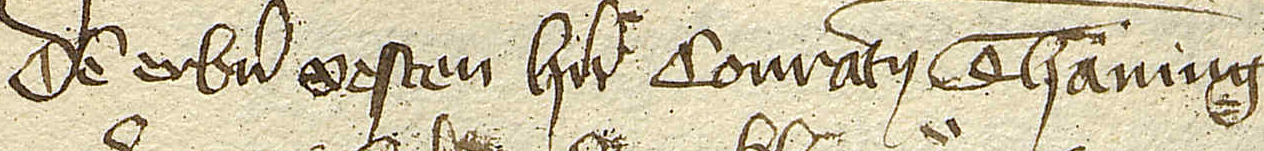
De* erbn* veſten hn* Conratn* Thaning*
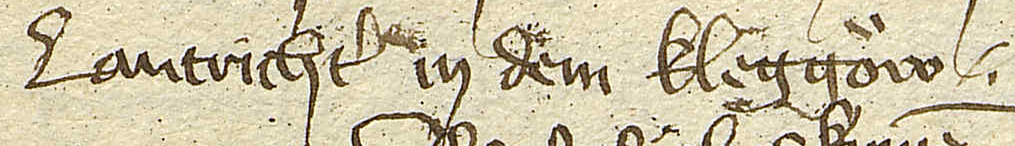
Lantricht* in dem kleggöw / .
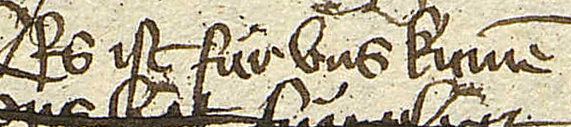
Es iſt für vns kume*
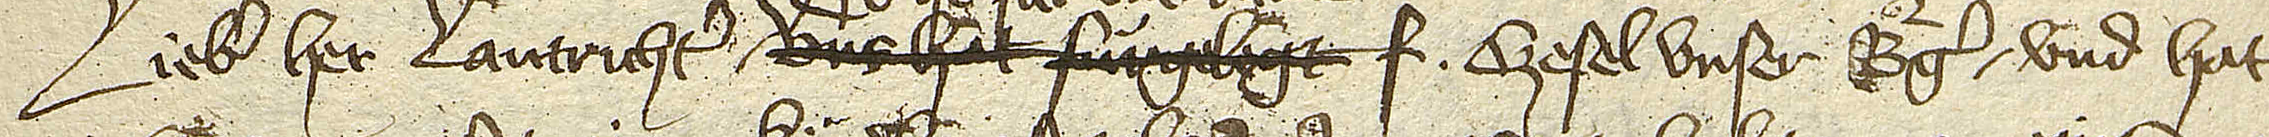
Lieb* her Lantricht* / Vns hat fürgelegt f . Cʒeſel vnſer B*g* / vnd hat
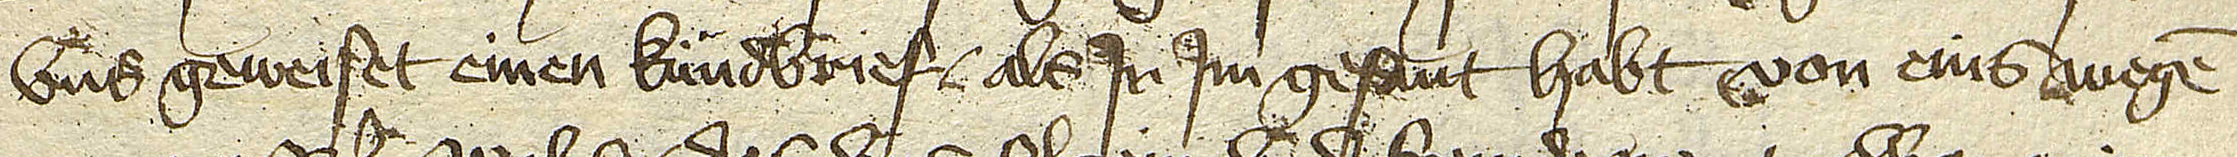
vns geweiſet einen kündbrief / als Ir Im geſant habt von eins wege*
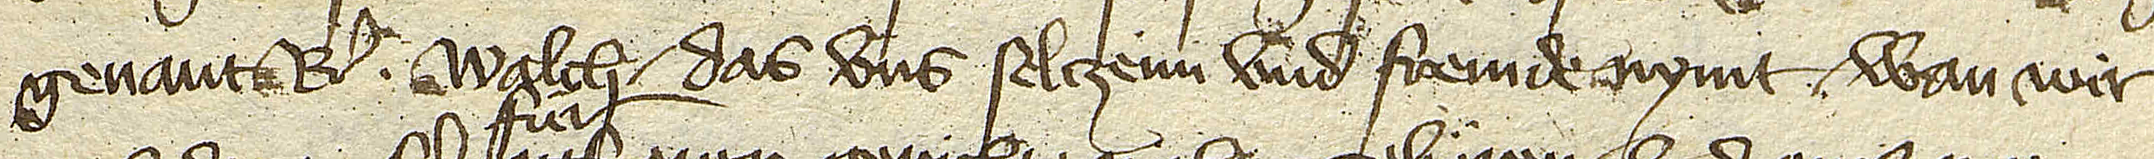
genant B* . walch / das vns ſelcʒeim vnd fremde nymt / wan wir
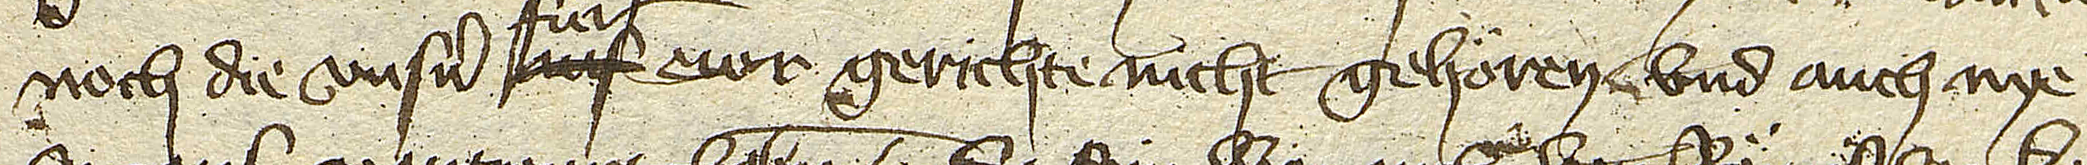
noch die vnſn* auf ewr gerichte nicht gehören/ vnd auch nye
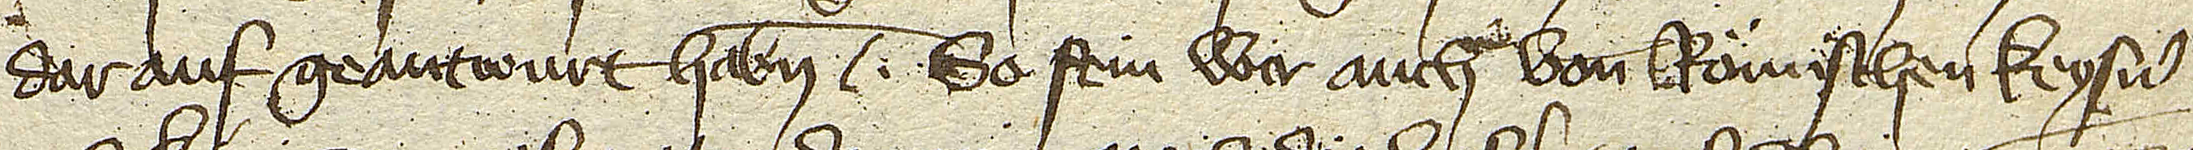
darauf geantwurt habn* / . So ſein wir auch von Römiſchen keyſn*
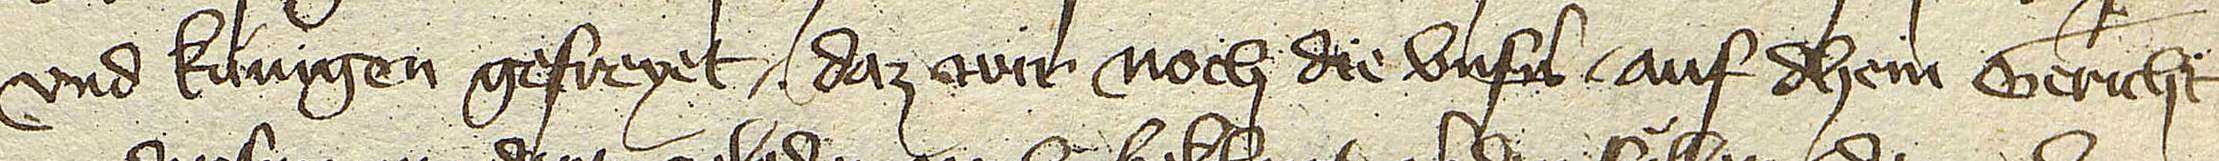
vnd künigen gefreyet / . daʒ wir noch die vnſn* / auf dhein Gericht
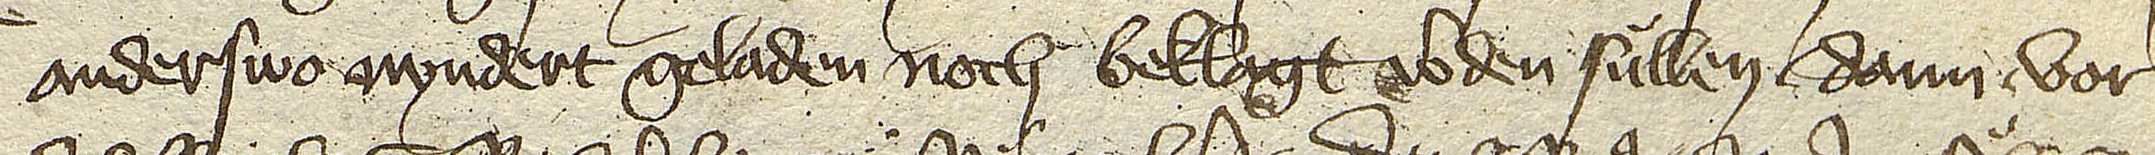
anderſwo nyndert geladen noch beklagt w*den ſüllen / dann / vor
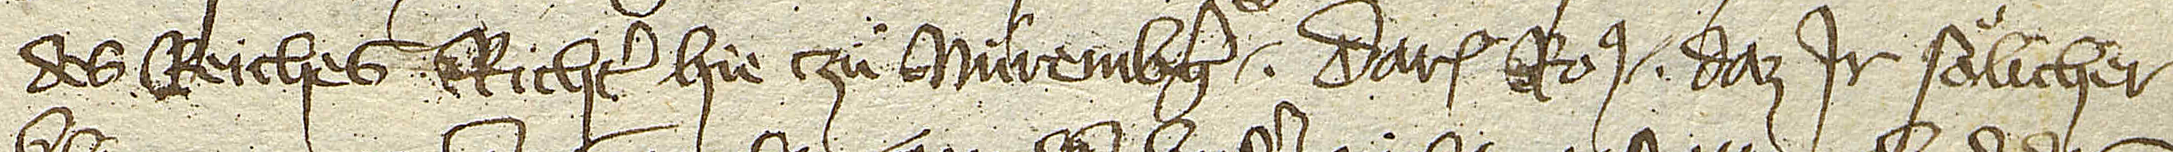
des Reiches Richt* hie cʒü Nüremb*g / . Dar* Ro* / . daʒ Ir ſölicher
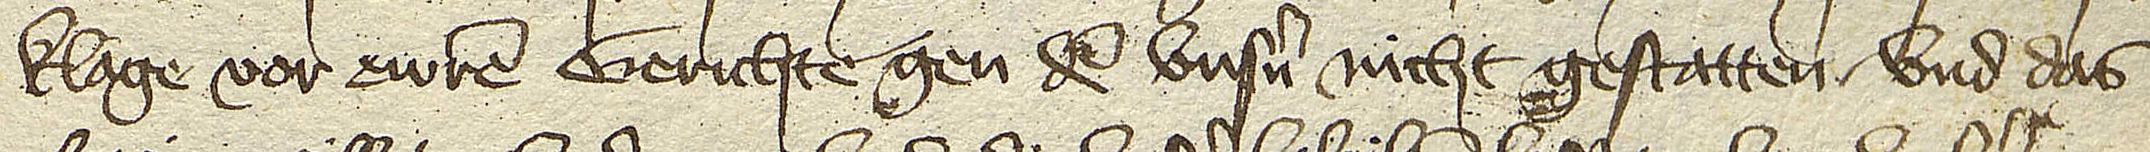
klage vor ewre* Gerichte gen d* vnſn* nicht geſtatten / vnd das
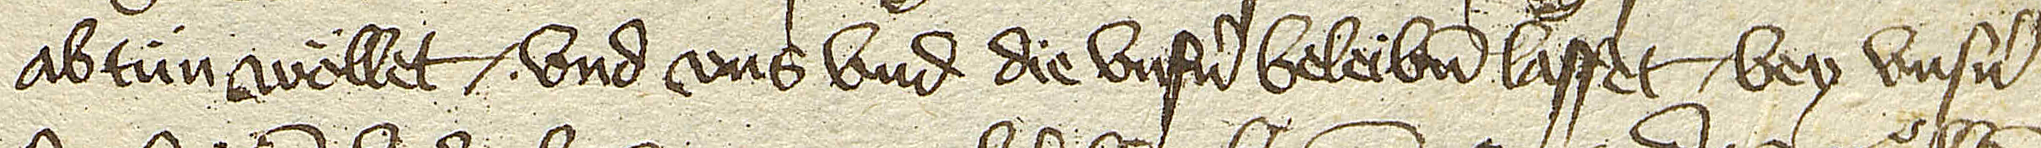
abtün wöllet / . vnd vns vnd die vnſn* beleibn* laſſet / bey vnſn*
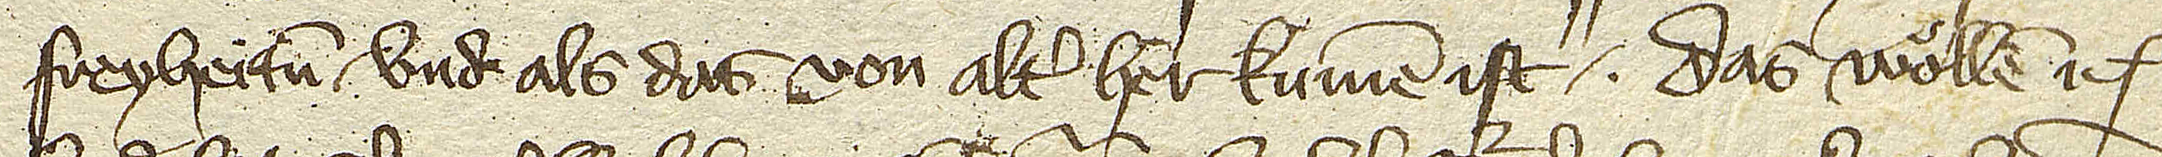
freyheitn* / vnd als das von alt* her kume* iſt / . Das wölle* ec*
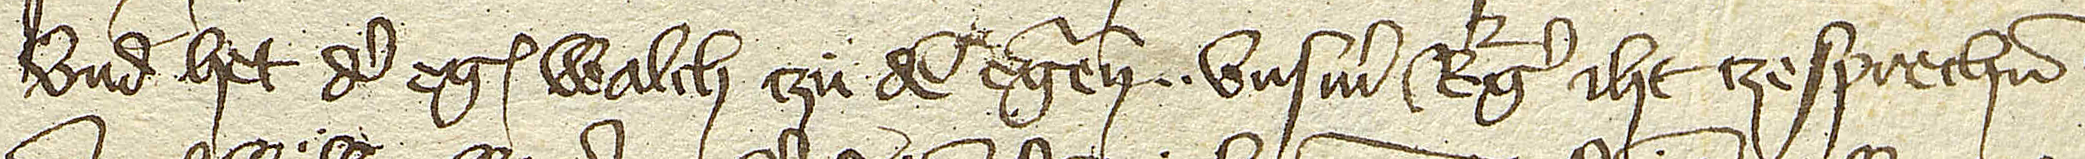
vnd het d* eg* walch cʒü d* egen* ~ vnſm* B*g* iht cʒeſprechn*
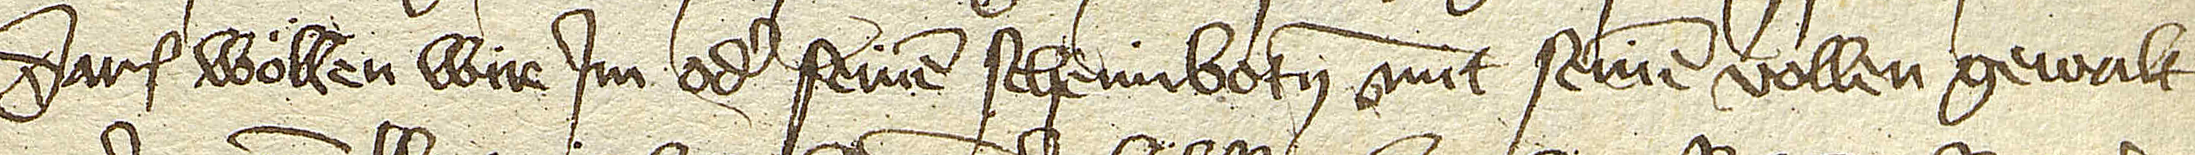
Dar* wöllen wir Im od* ſeine* ſcheinbotn* mit ſeine vollen gewalt
